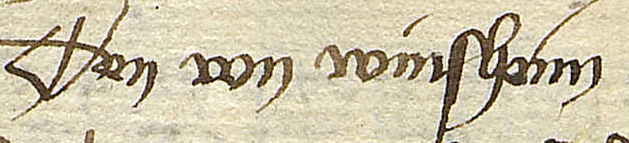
Den von winſheim
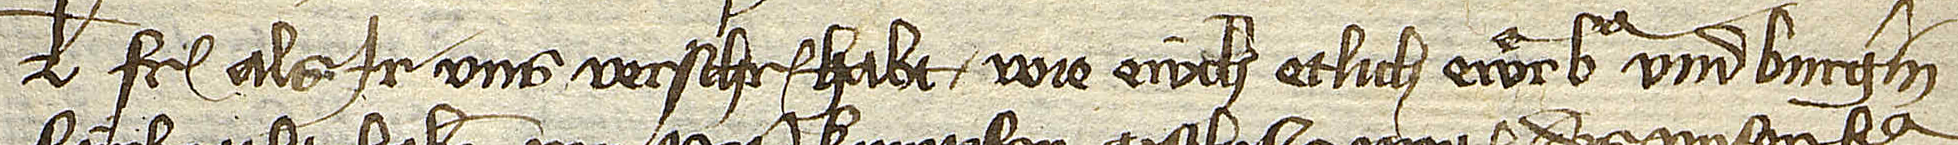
L* fr* als Ir vns verſchr* habt / wie eẅch etlich eẅr b* vnd burg*in
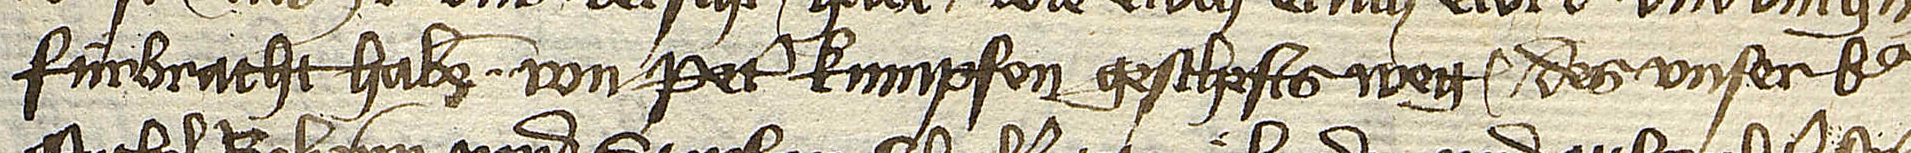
fürbracht habe* ~ von Pet* kumpfen geſchefts weg* / des vnſer b*
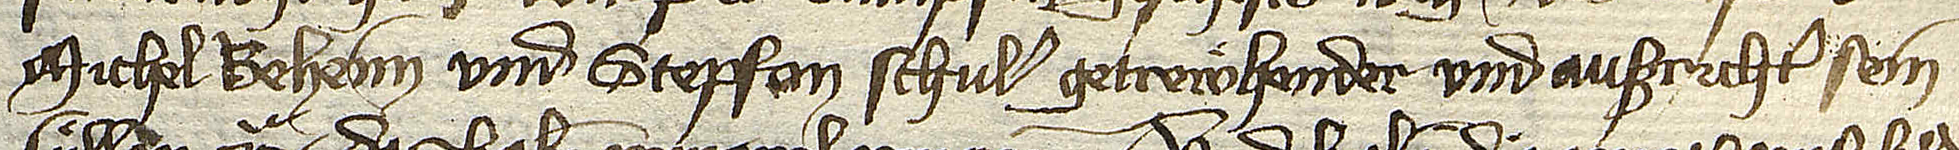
Michel Beheim vnd Stepfan ſchul* getreẅhender vnd auſʒricht* ſein
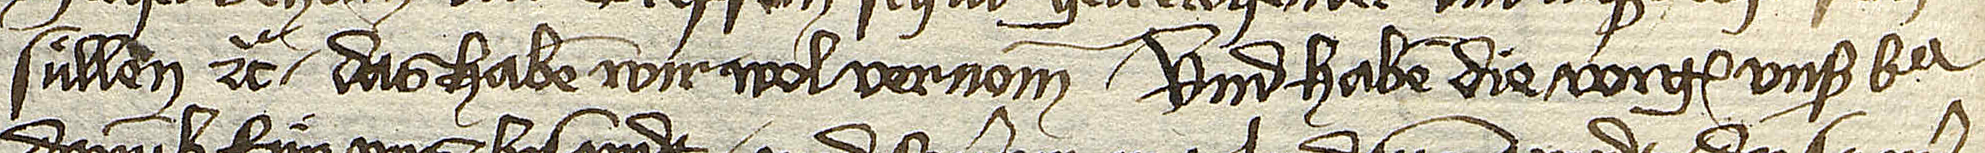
ſüllen ec* / das habe* wir wol vernom* / Vnd habe* die vorg* vnſ* b*
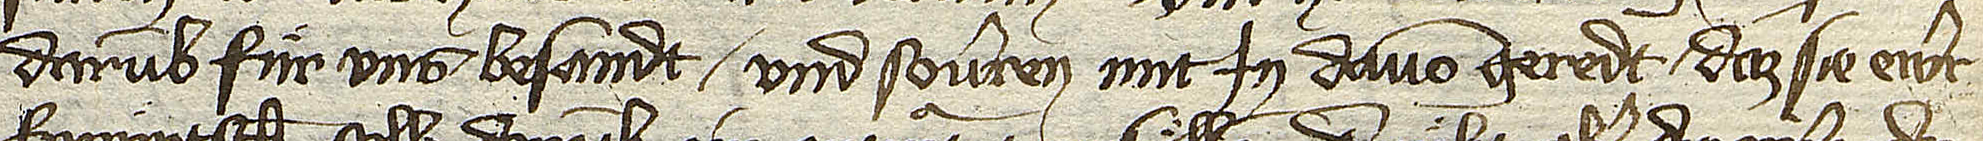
darub* für vns beſandt / vnd ſou*ren mit In dauo* geredt / daʒ ſie ewr*
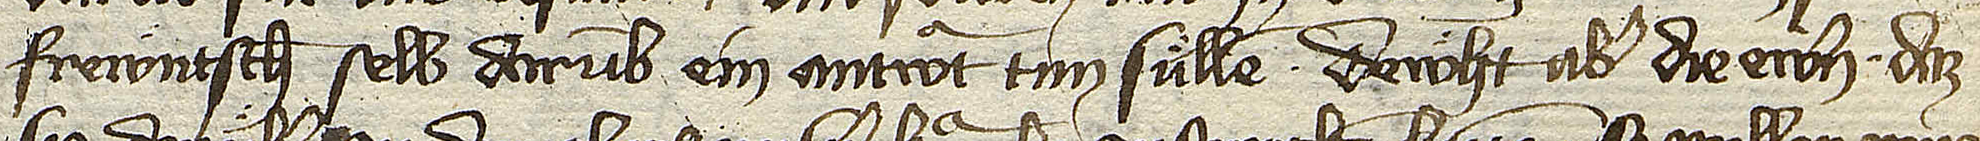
freẅntſch* ſelb darub* ein antwt* tun ſülle* . Deẅht ab* die eẅ*n . daʒ
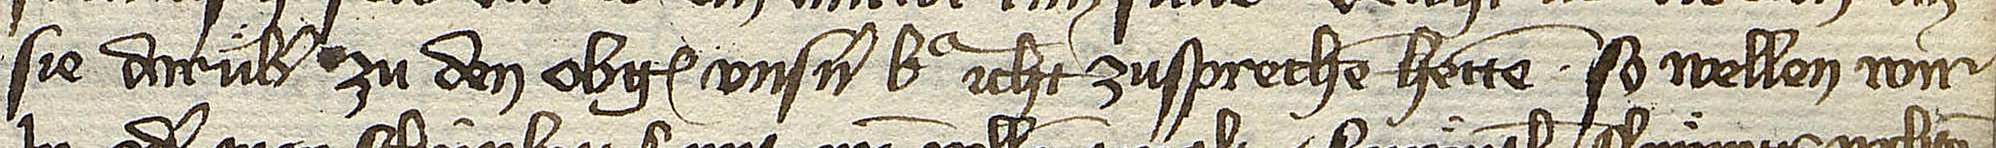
ſie darüb* ʒu den obg* vnſ*n b* icht ʒuſpreche* hette* . ſo wellen wir
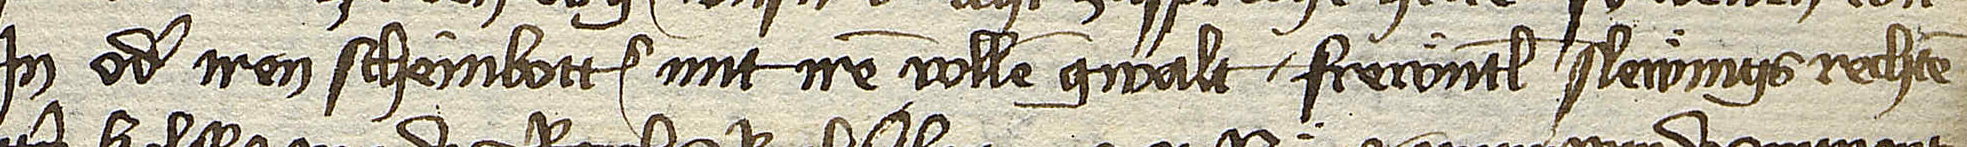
In od* iren ſcheinbott* mit ire* volle* gwalt / freẅntl* ſleẅnigs rechte*
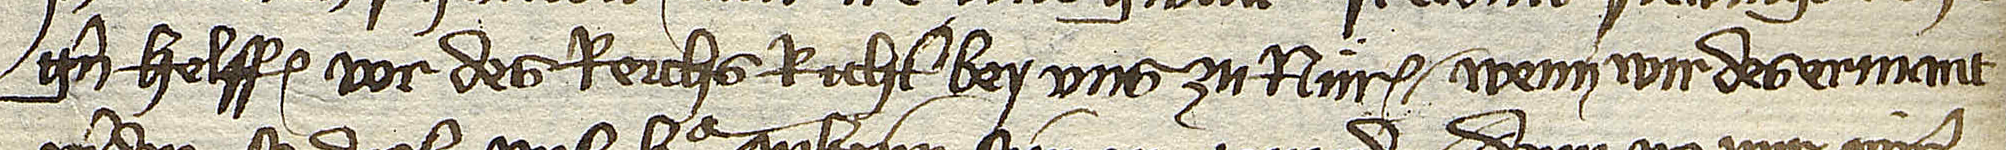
g*n helff* vor des Reichs Richt* bey vns ʒu Nür* / wenn wir des ermant
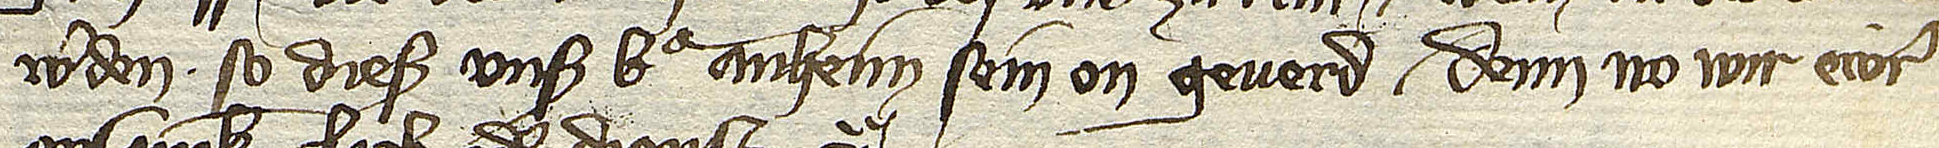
w*den . ſo dieſ* vnſ* b* anheim ſein on geuerd / Denn wo wir eẅr*
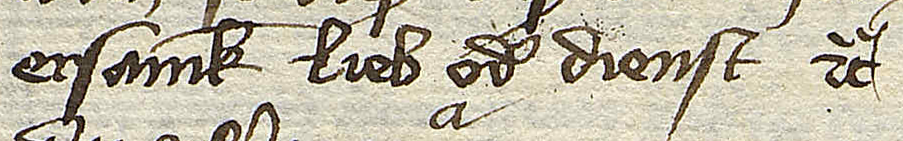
erſamk* lieb od* dienſt ec*
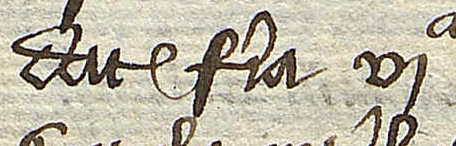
Dat* fia* vi*
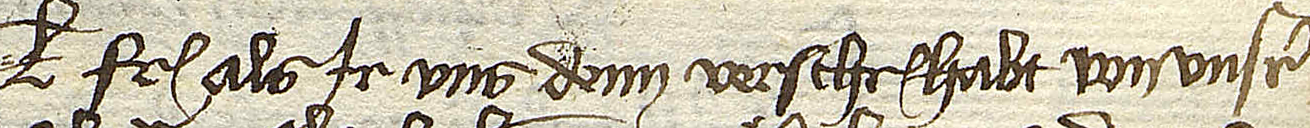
L* fr* als Ir vns denn verſchr* habt von vnſ*r
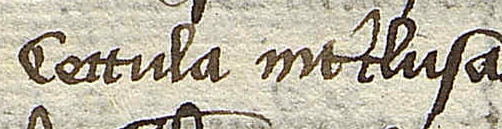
Cettula int*cluſa
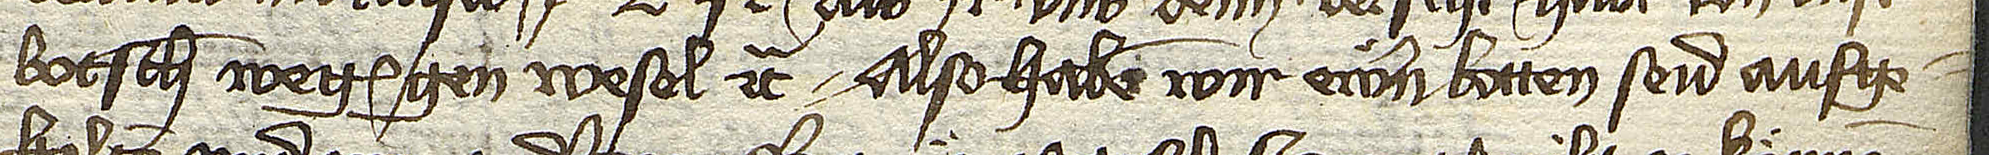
botſch* weg* gen weſel ec* / Alſo habe* wir eẅ*n botten ſeid aufge =
